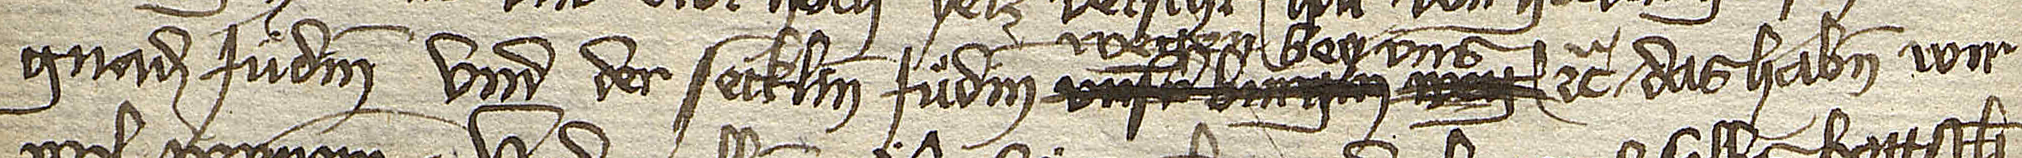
gnad* Iüdin vnd der ſecklin* Iüdin* vnſn* burgin* weg* ec* / das habn* wir
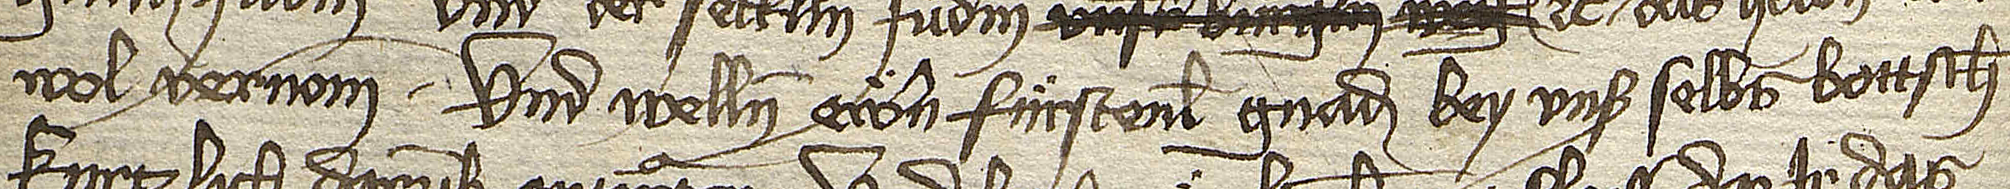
wol vernom* / Vnd welln* ew*n fürſtenl* gnad* bey vnſ* ſelbs bottſch*
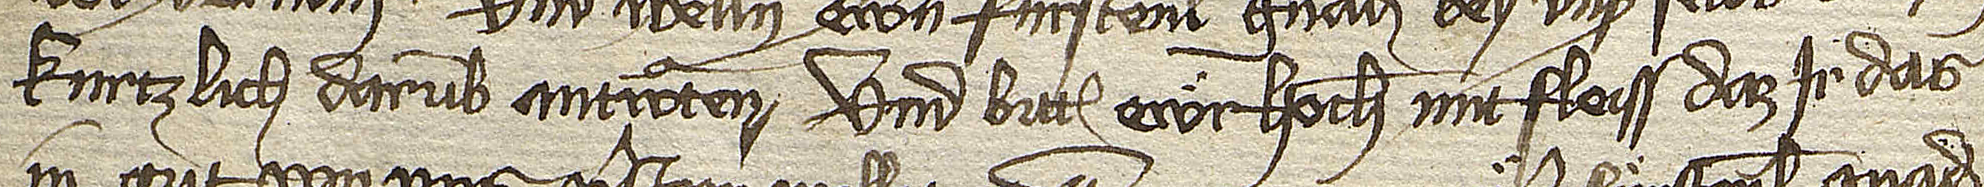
kurcʒlich darub* antw*ten / Vnd bitt* ewr hoch* mit fleiſſ daʒ Ir das
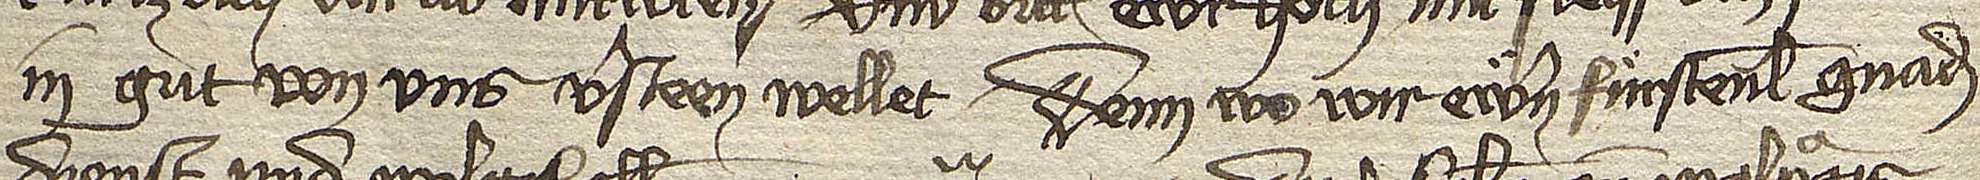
in gut von vns v*ſteen wellet / Denn wo wir ew*n fürſtenl* gnad*
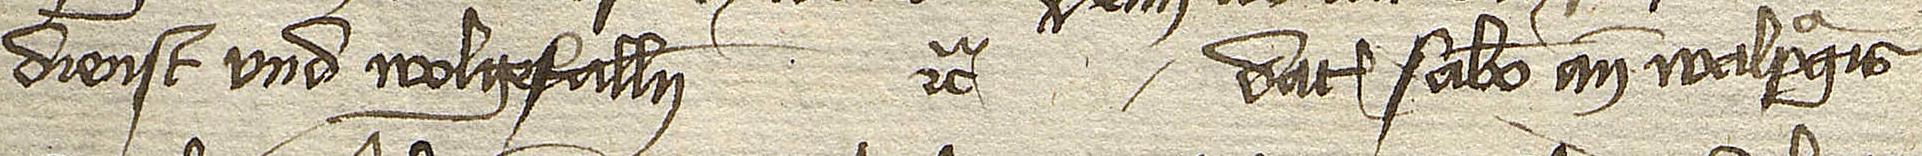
dienst vnd wolgefalln* ec* / dat* ſabo* an* walp*gis
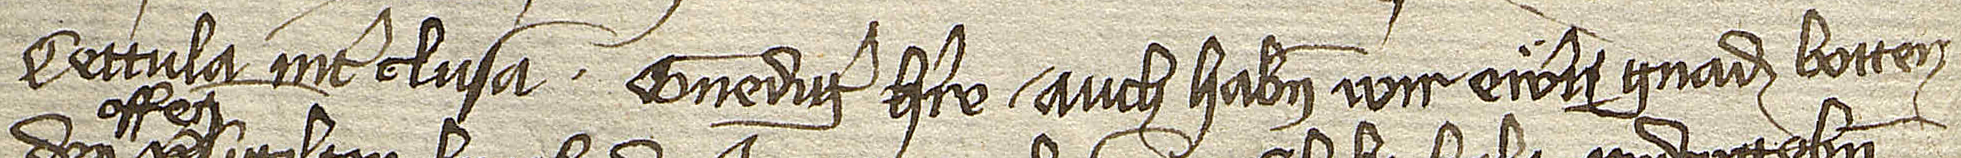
Cettula int*clusa . Gnedig* h*re / auch habn* wir ew*n gnad* botten
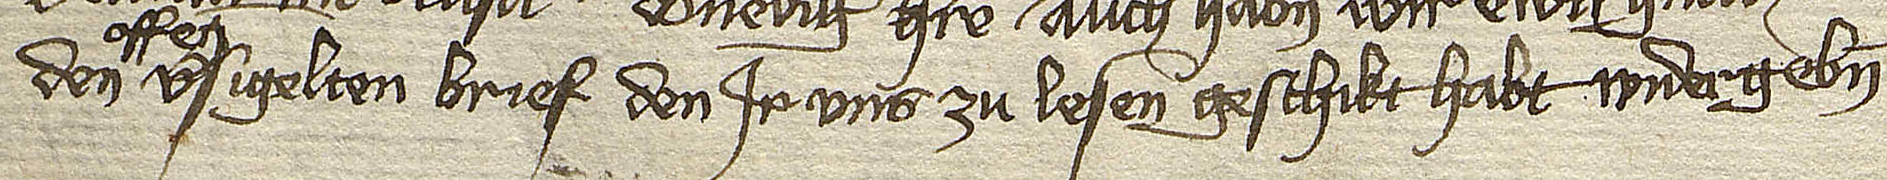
den v*ſigelten brief den Ir vns ʒu leſen geſchikt habt widergebn*
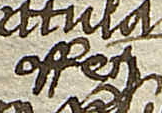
offen
